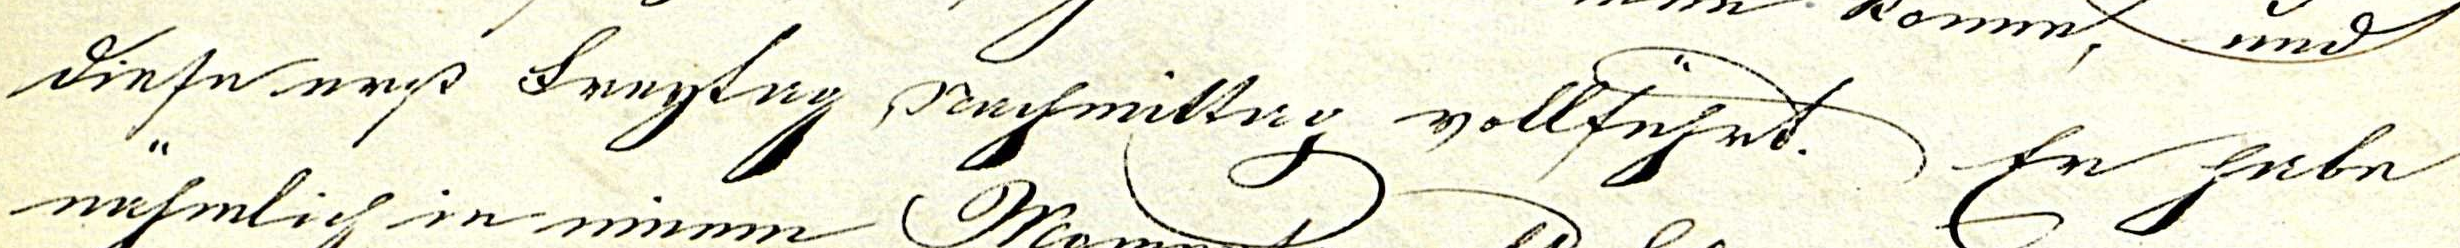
diese erst Freytag Nachmittag vollführt. Er habe
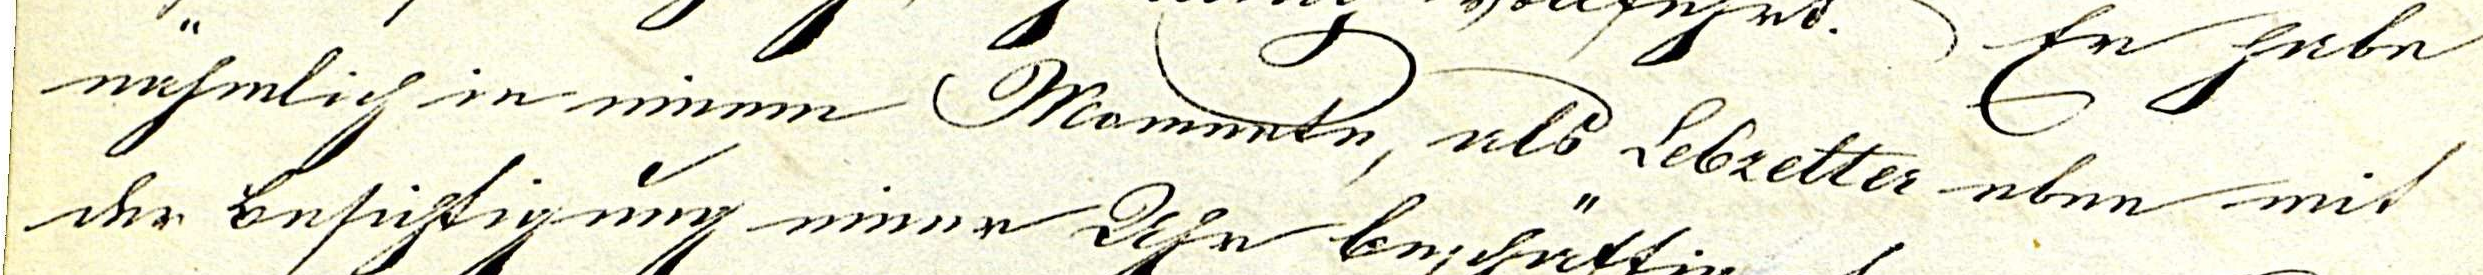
nämlich in einem Momente, als Lebzelter eben mit
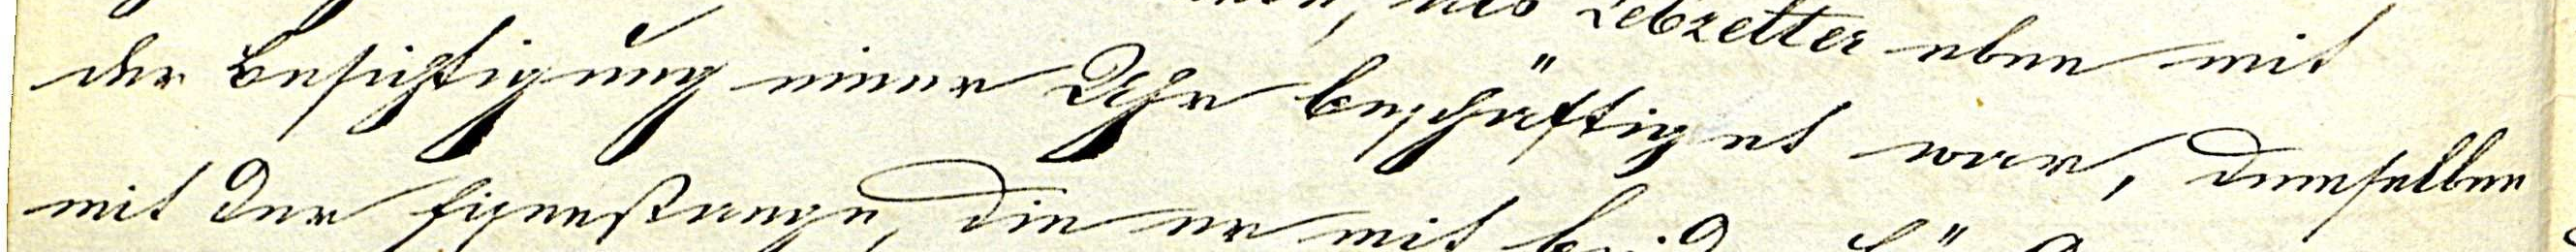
der besichtigung einer Uhr beschäftiget war, demselben
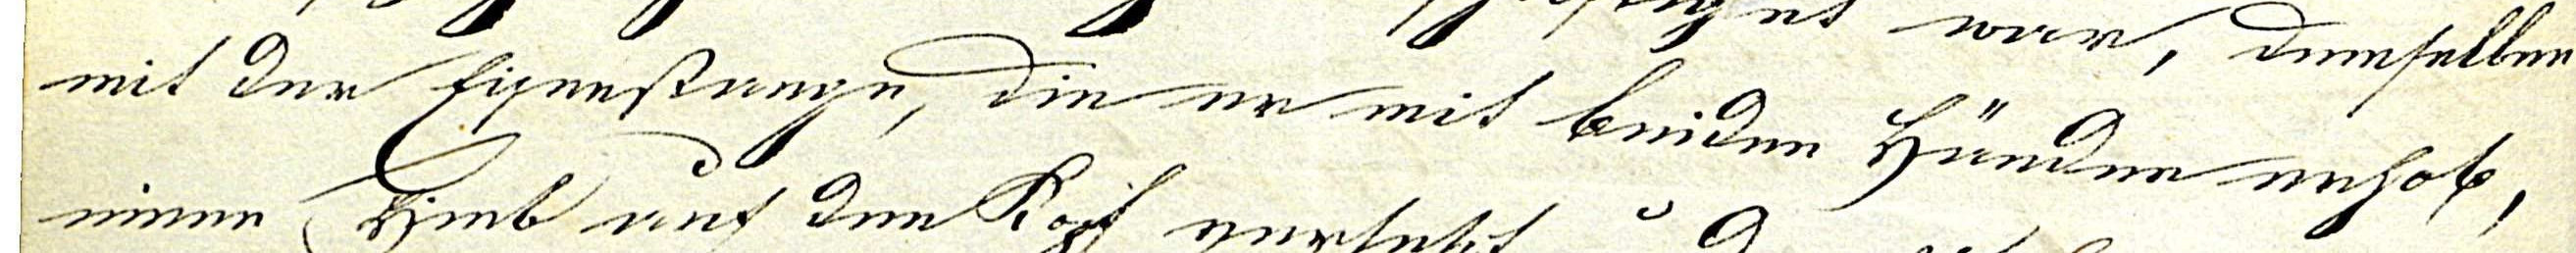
mit der Eisenstange, die er mit beidem Händen erhob,
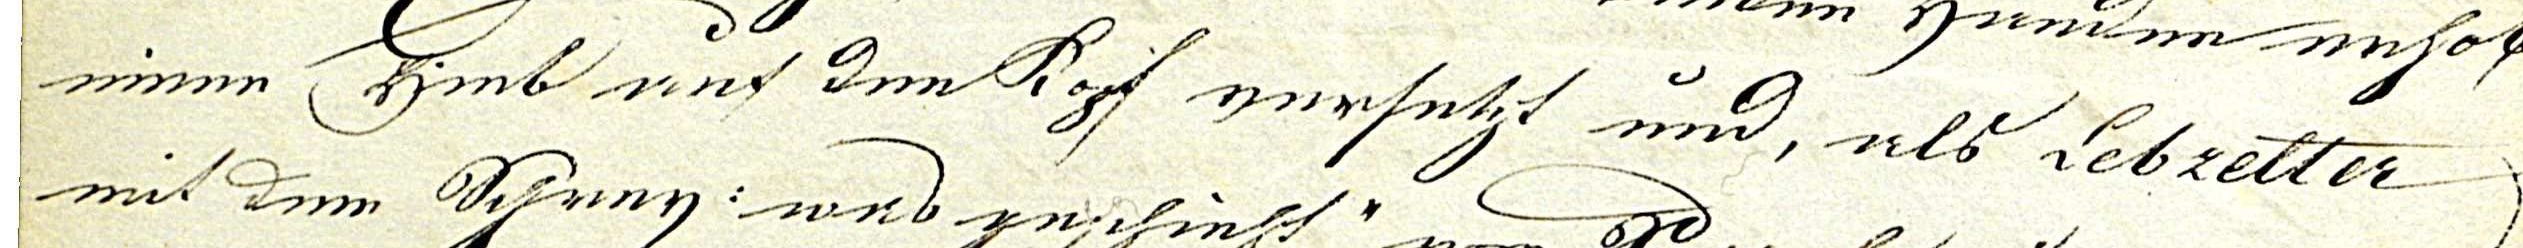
einer Hieb auf den Kopf versetzt und, als Lebzelter
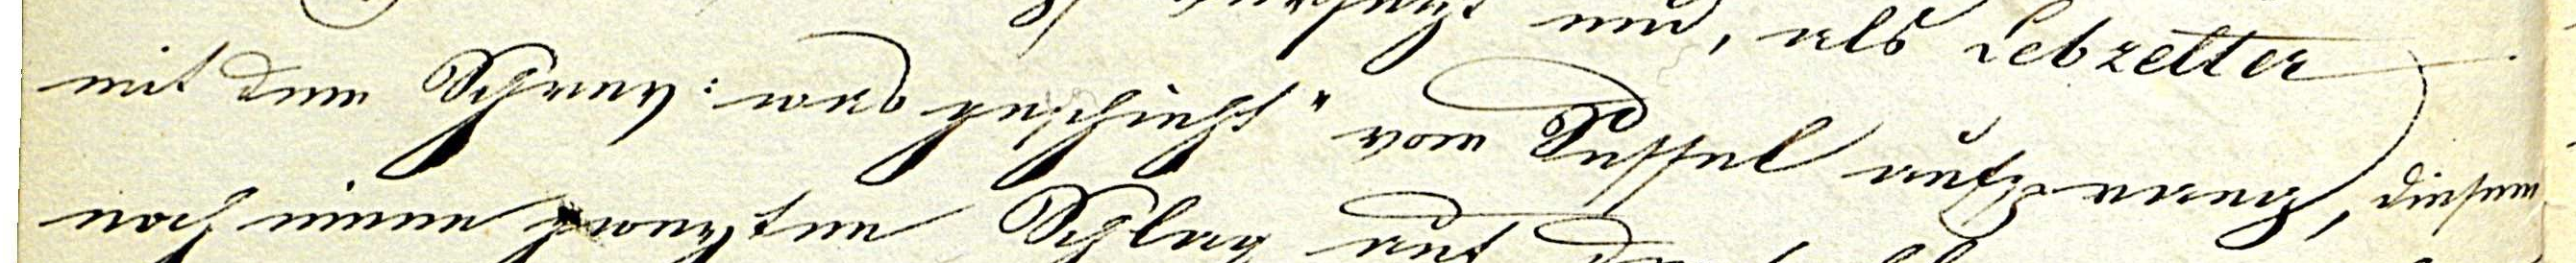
mit dem Schrey: „was geschieht“ vom Sessel aufsprang, diesem
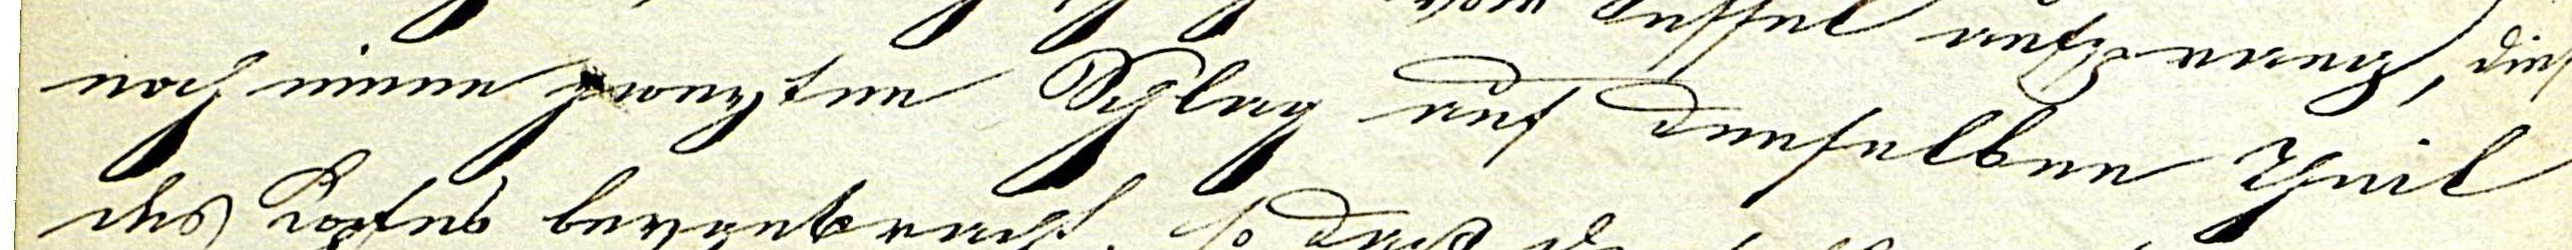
noch einen zweyten Schlag auf denselben Theil
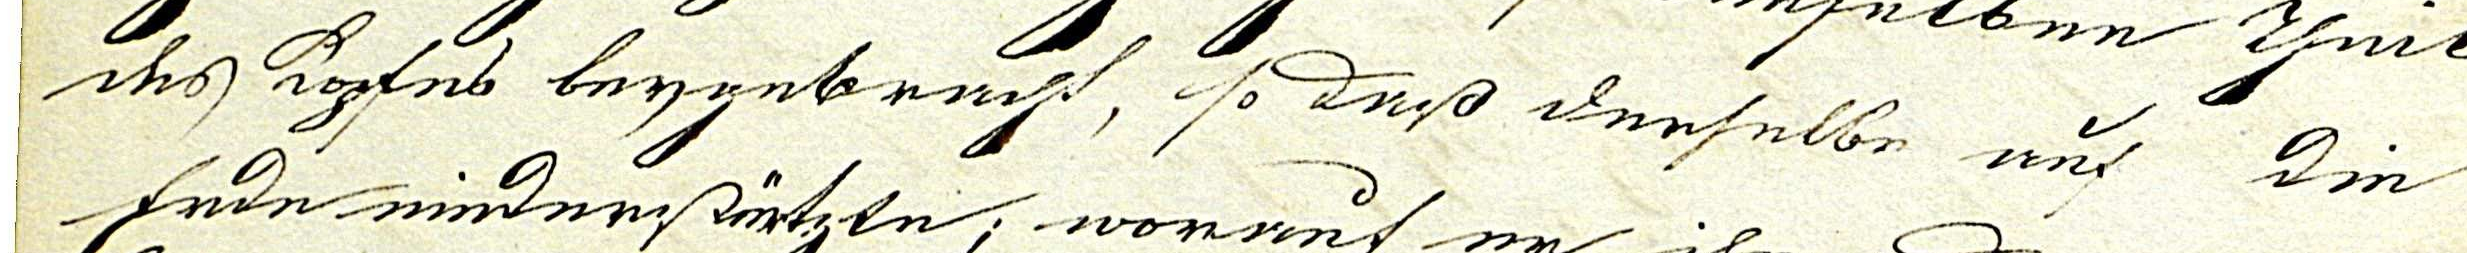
des Kopfes beygebracht, so daß derselbe auf
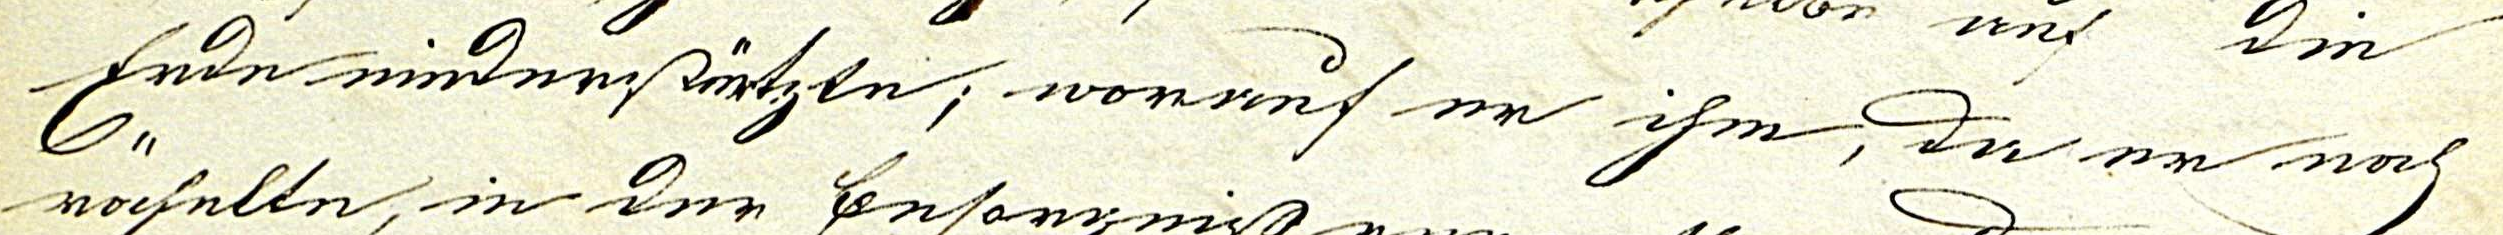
Erde niederstürtzte; worauf er ihm, da er noch
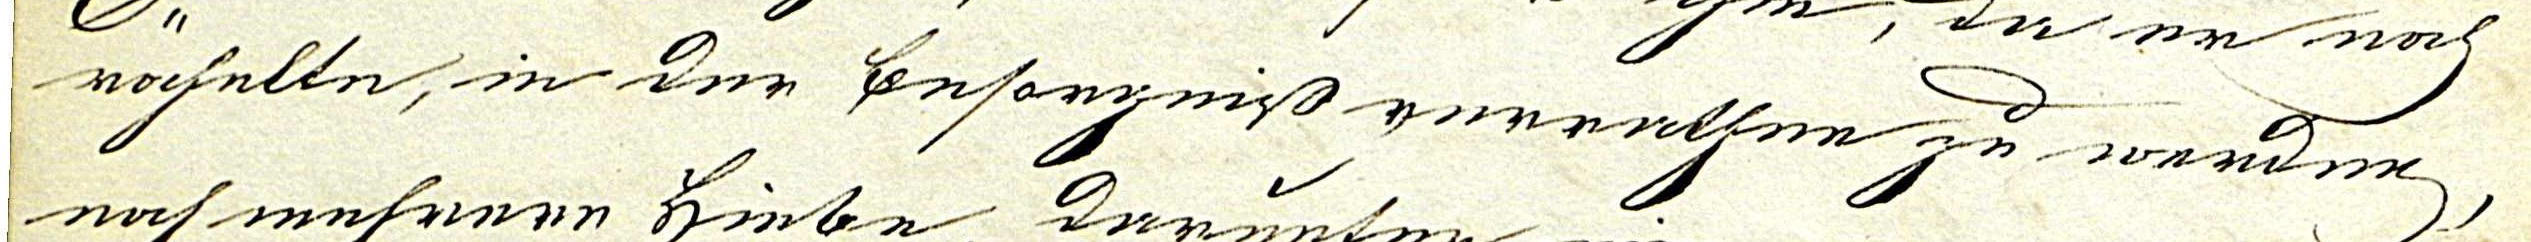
röchelte, in der besorgniß verrathen zu werden,
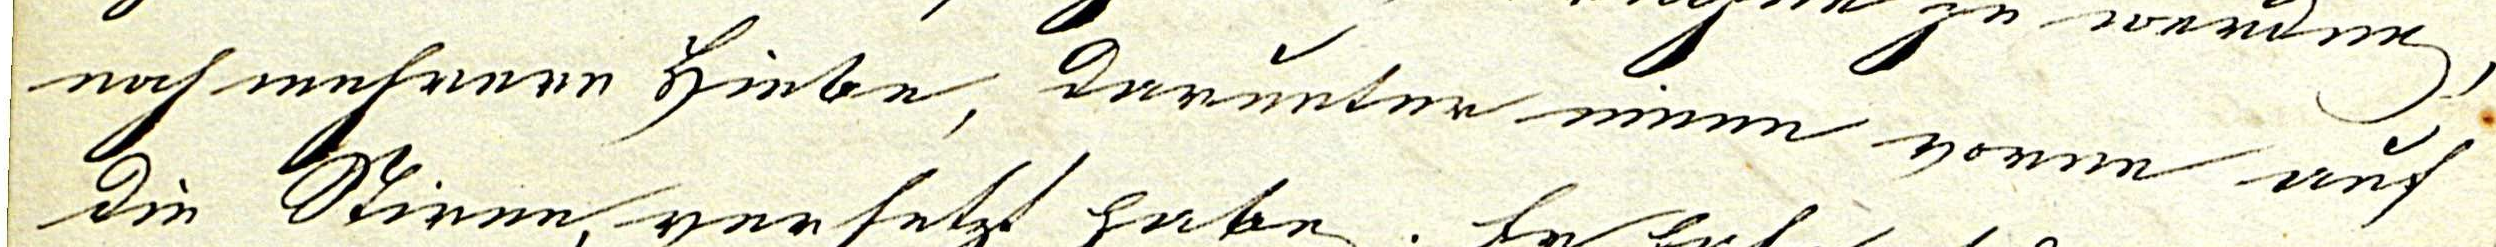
noch mehrere Hiebe, darunter einen vorne auf
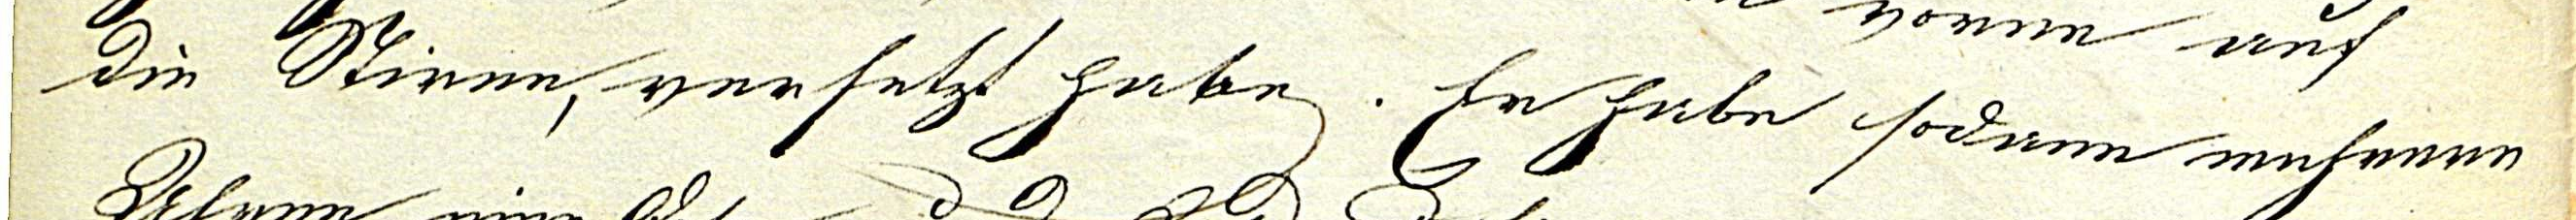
die Stirne, versetzt habe. Er habe sodann mehrere
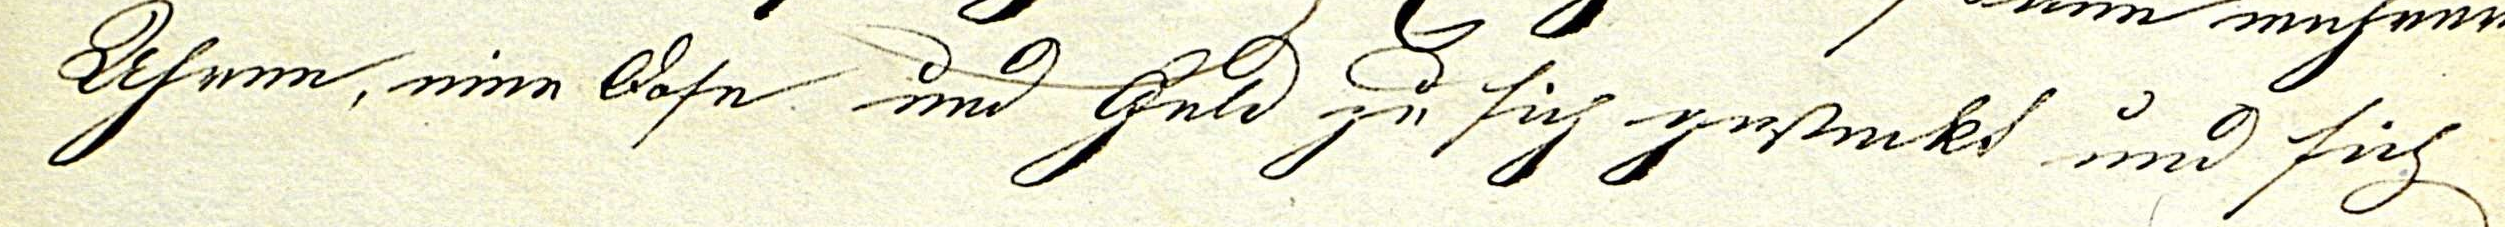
Uhren, eine Dose und Geld zu sich gesteckt und sich
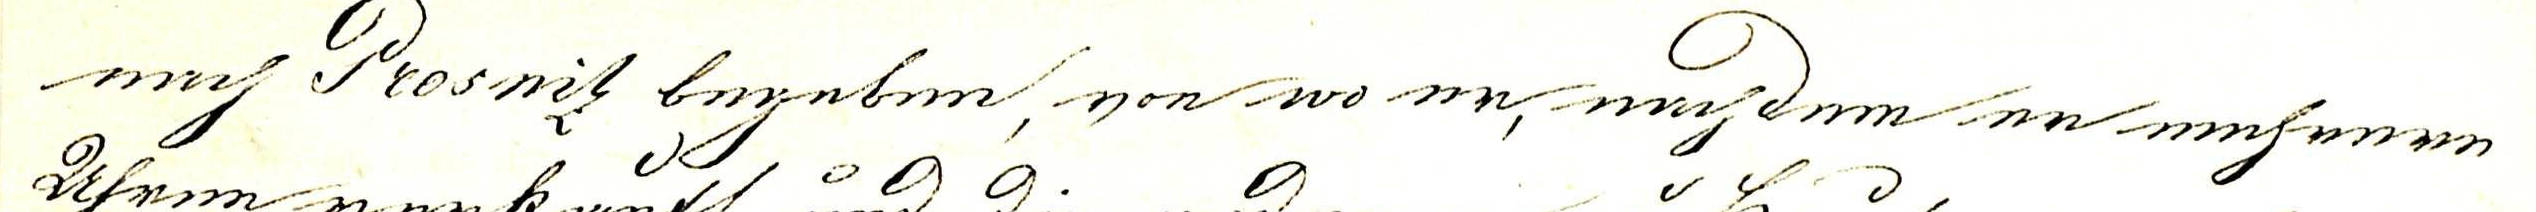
nach Prosnitz begeben, von wo er, nachdem er mehrere
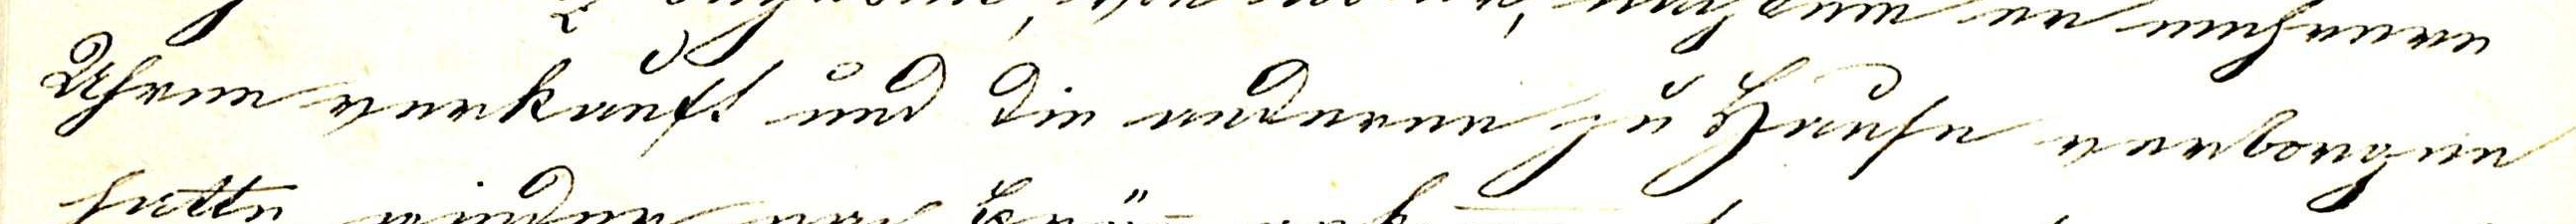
Uhren verkauft und die anderen zu Hause verborgen
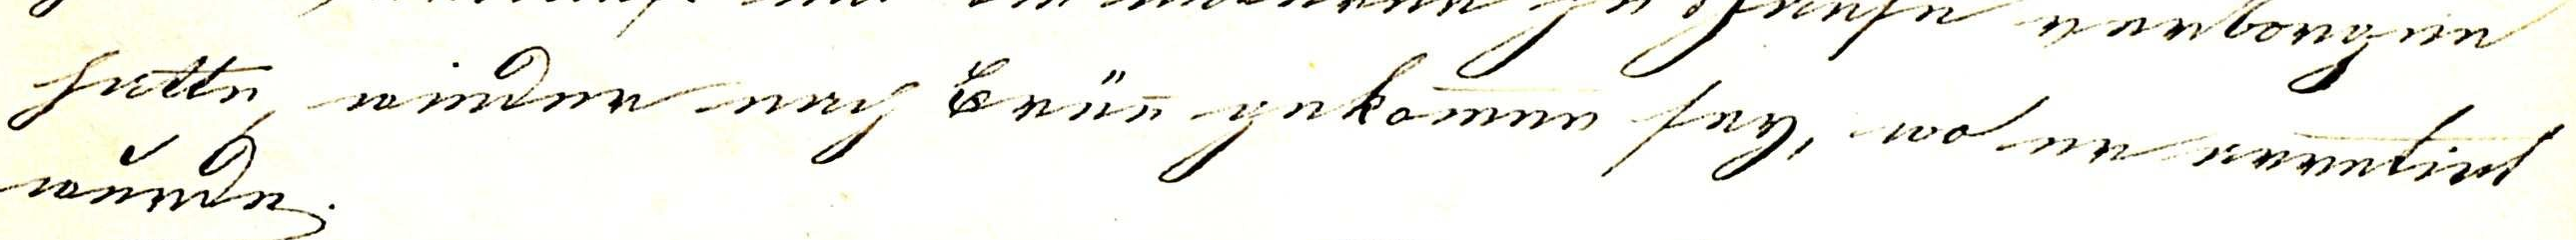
hatte wieder nach Brünn gekommen sey, wo er arretirt
